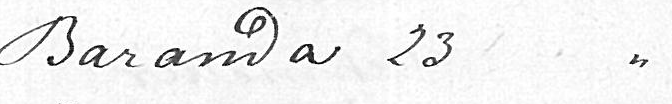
Barranda 23 "
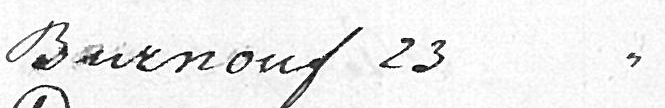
Burnouf 23 "
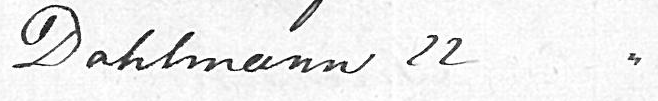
Dahlmann 22 "
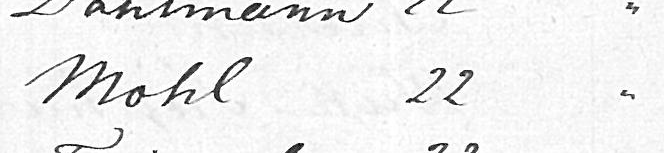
Mohl 22 "
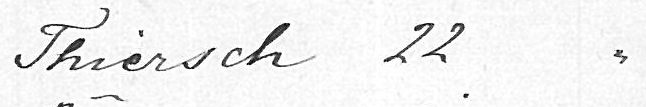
Thiersch 22 "
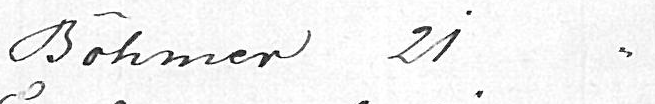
Böhmer 21 "
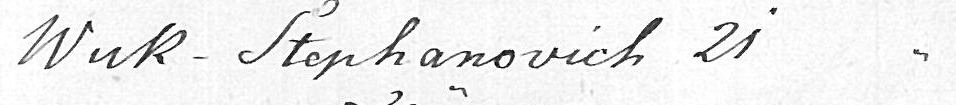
Wuk-Stephanovich 21 "
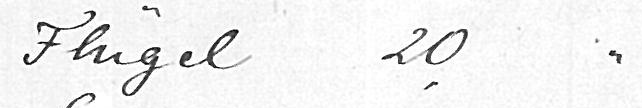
Flügel 20 "
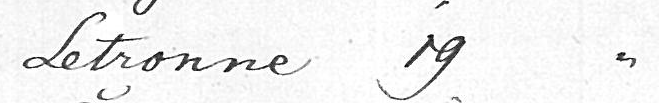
Letronne 19 "
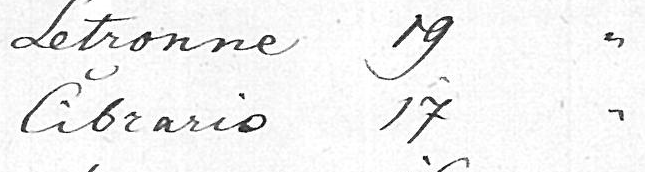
Cibrario 17 "
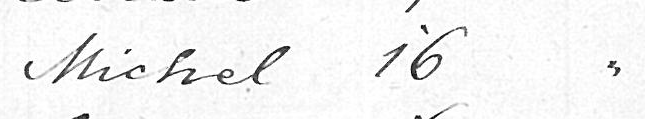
Michel 16 "
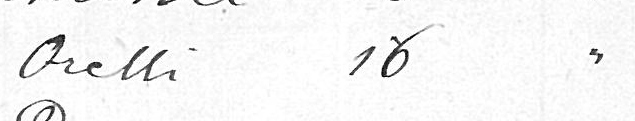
Orelli 16 "
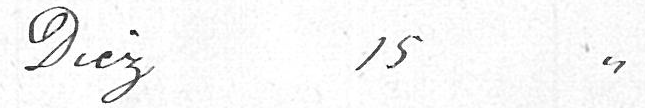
Diez 15 "
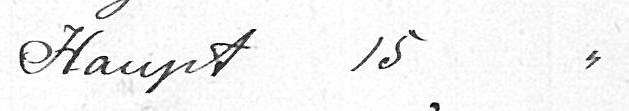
Haupt 15 "
